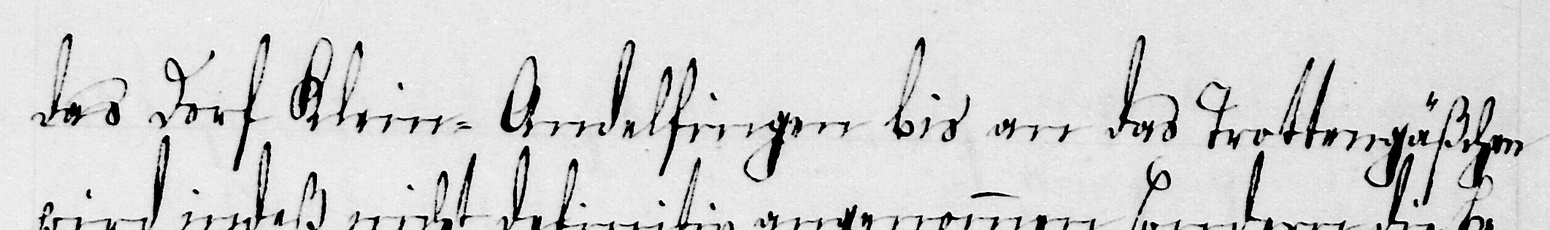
das Dorf Klein-Andelfingen bis an das Trottengäßchen
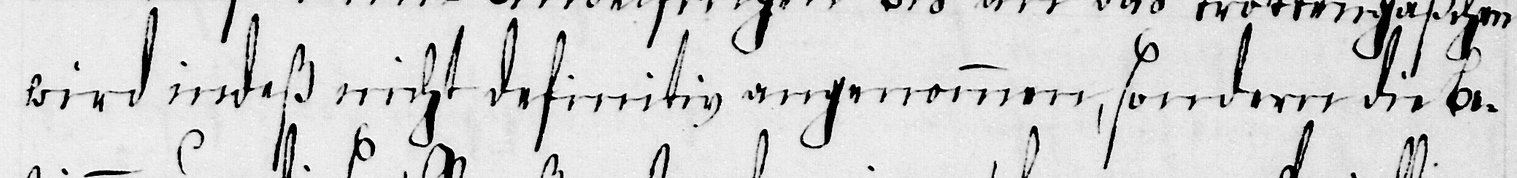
wird indeß nicht definitiv angenommen, sondern die Be¬
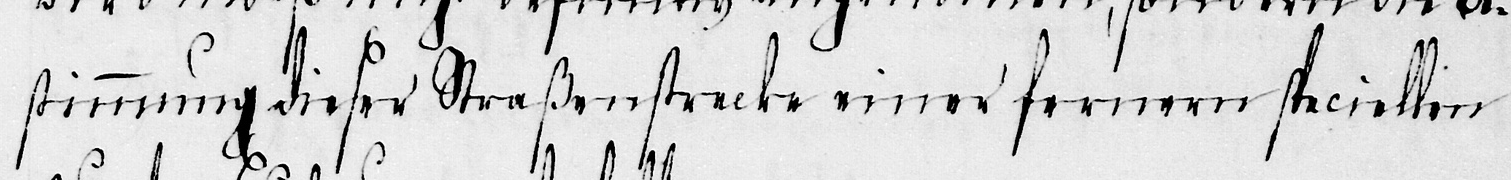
stimmung dieser Straßenstrecke einer fernern speciellen
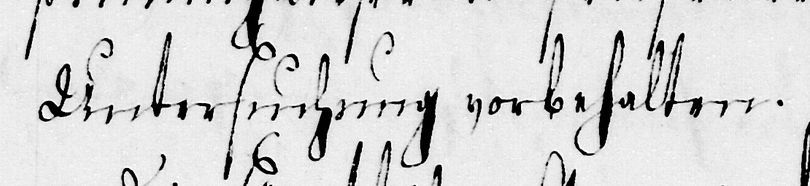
Untersuchung vorbehalten.
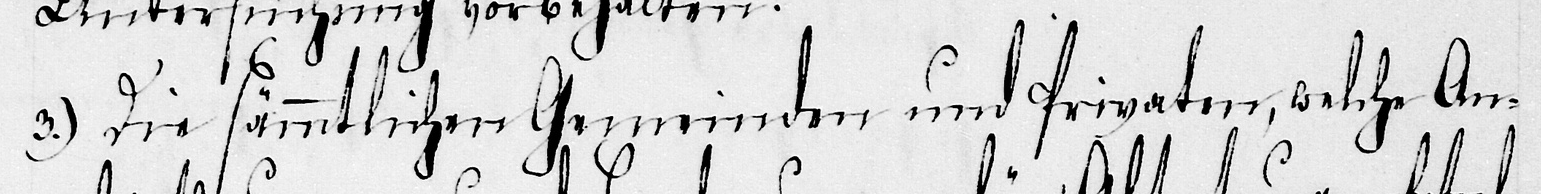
3.) Die sämmtlichen Gemeinden und Privaten, welche An¬
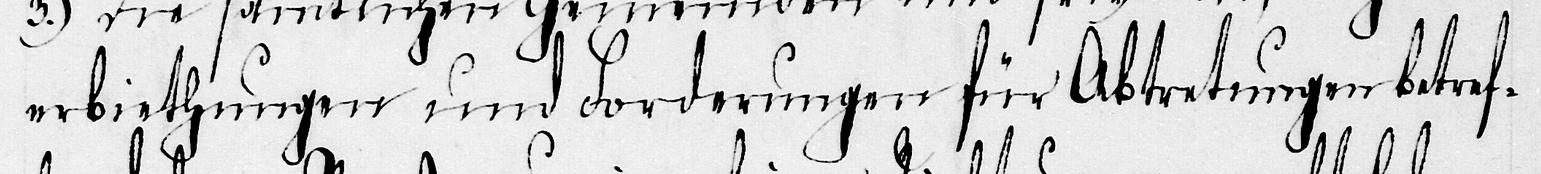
erbiethungen und Forderungen für Abtretungen betref¬
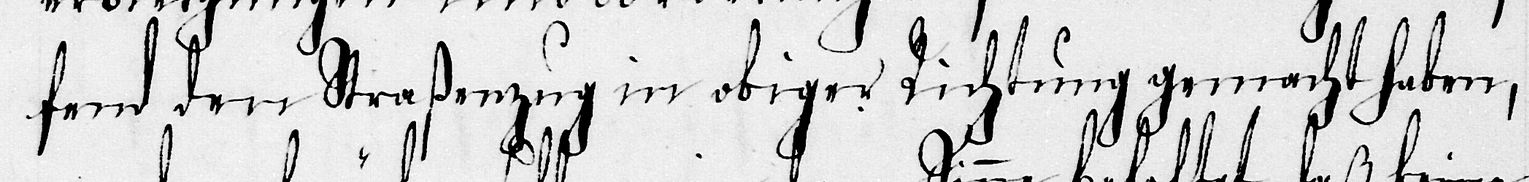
fend den Straßenzug in obiger Richtung gemacht haben,
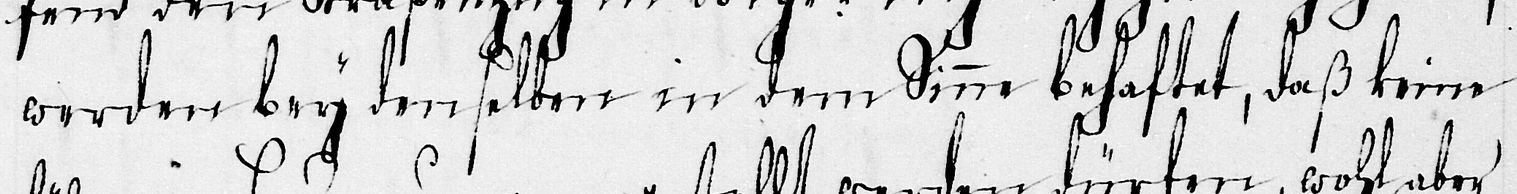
werden bey denselben in dem Sinne behaftet, daß keine
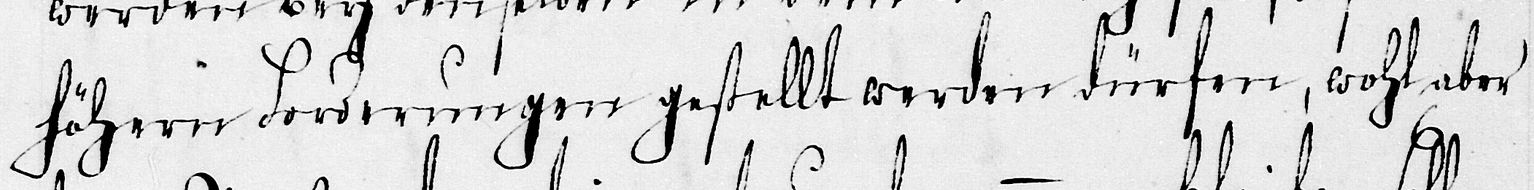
höhern Forderungen gestellt werden dürfen, wohl aber
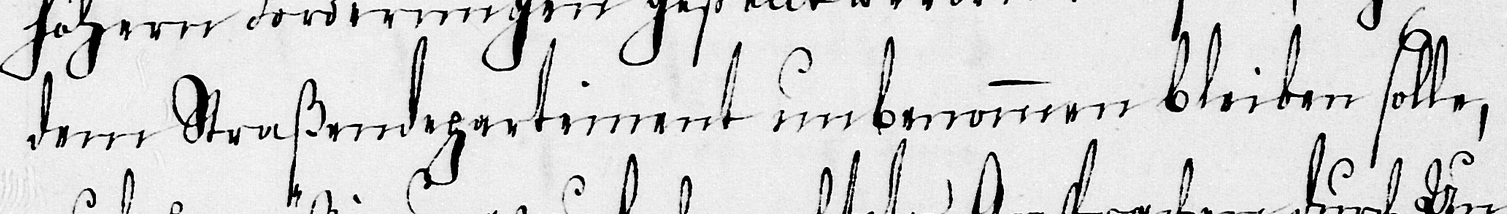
dem Straßendepartement unbenommen bleiben solle,
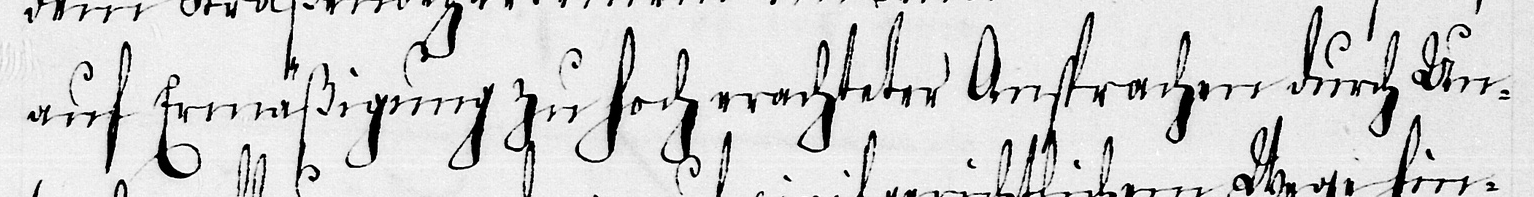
auf Ermäßigung zu hoch erachteter Ansprachen durch Un¬
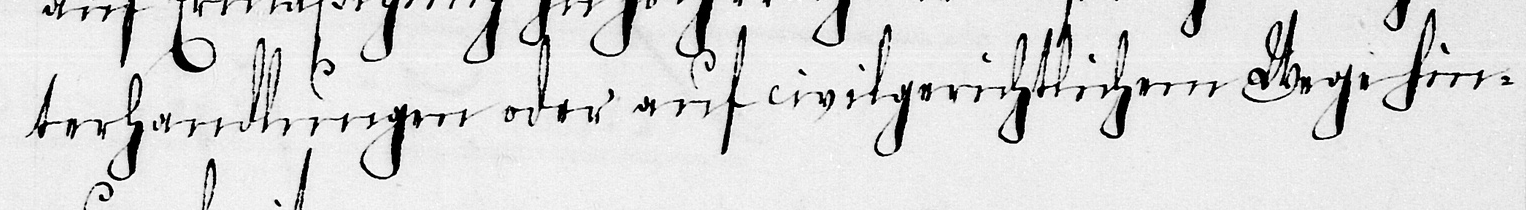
terhandlungen oder auf civilgerichtlichem Wege hin¬
